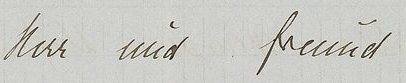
Herr und Freund.
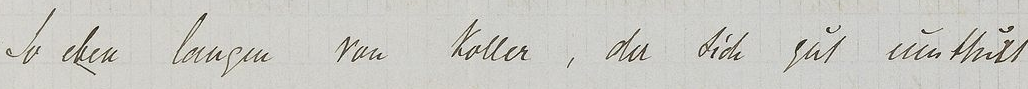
So eben langen von Koller, der sich gut umthut
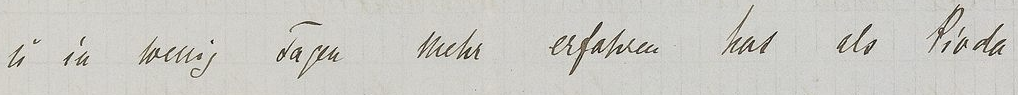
u in wenig Tagen mehr erfahren hat als Pioda
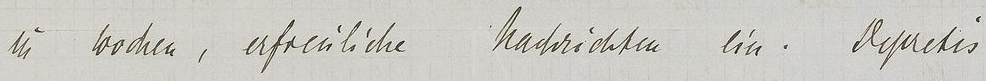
in Wochen, erfreuliche Nachrichten ein. Depretis
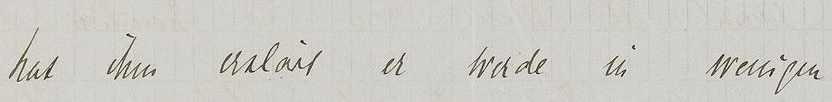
hat ihm erklärt er werde in wenigen
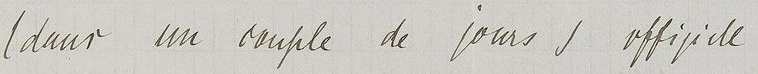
(dans un couple de jours) offiziell
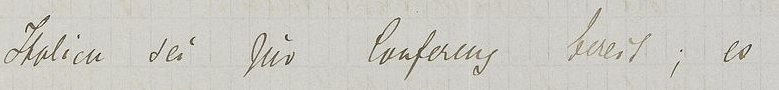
Italien sei zur Conferenz bereit; es
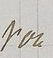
sich
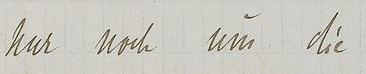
nur noch um die
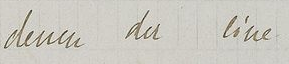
Bezeichnung der Delegirten
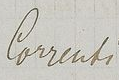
denen der
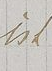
eine
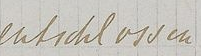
Correnti sein
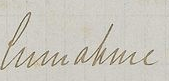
Annahme
